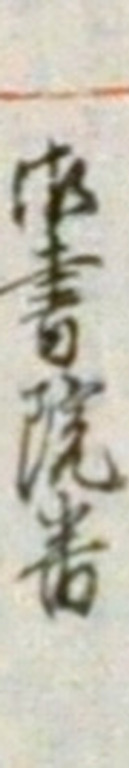御書院番
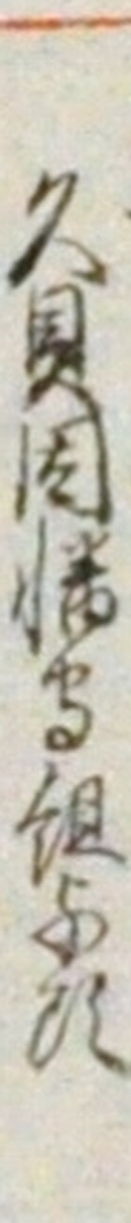久貝因幡守組与頭
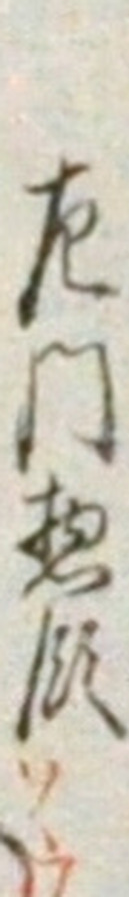左門惣領
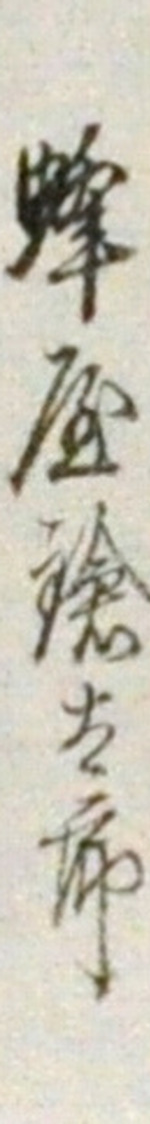蜂屋鎗太郎
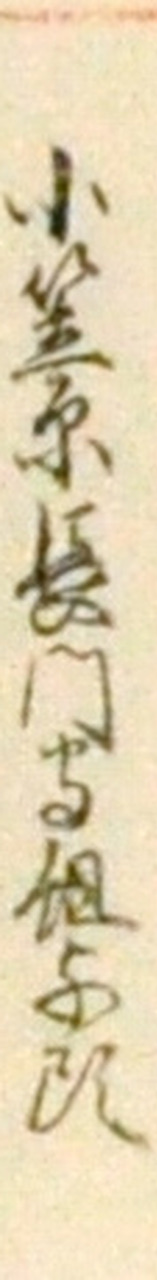小笠原長門守組与頭
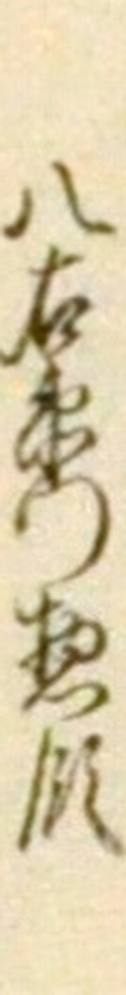八右衛門惣領
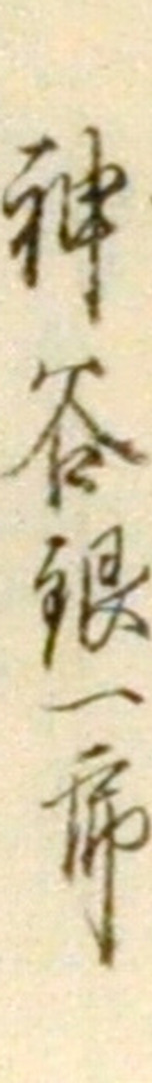神谷銀一郎

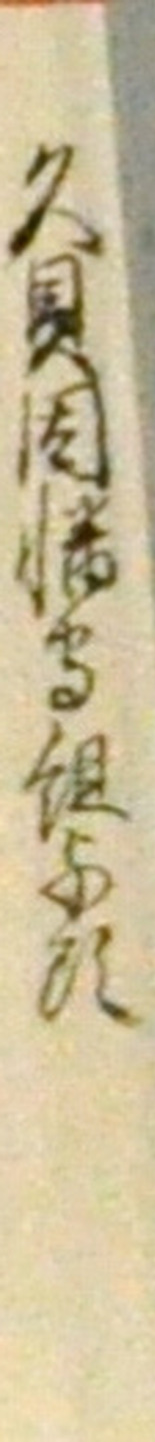久貝因幡守組与頭
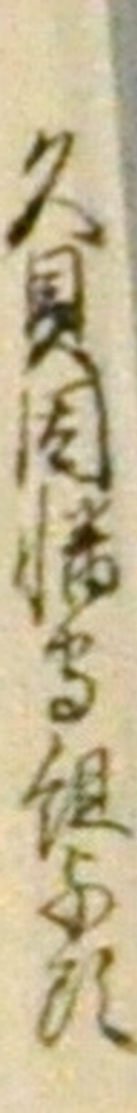久貝因幡守組与頭
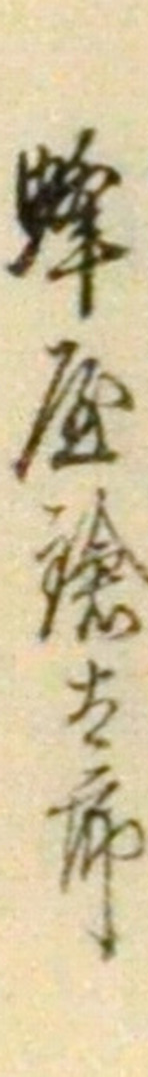蜂屋鎗太郎
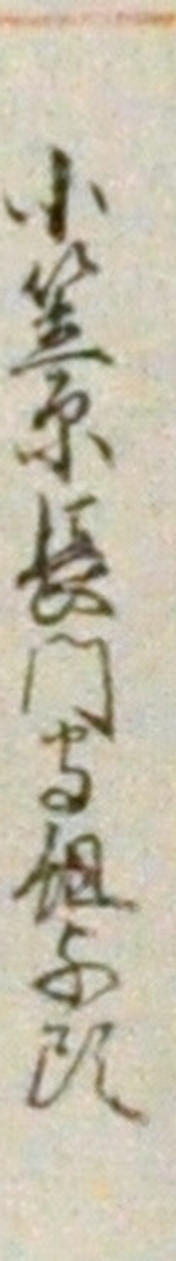小笠原長門守組与頭
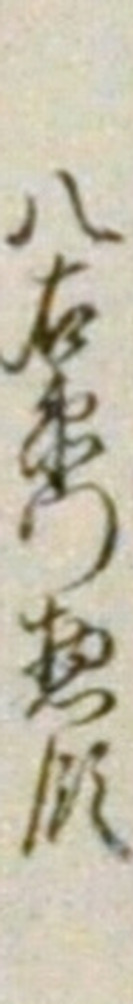八右衛門惣領
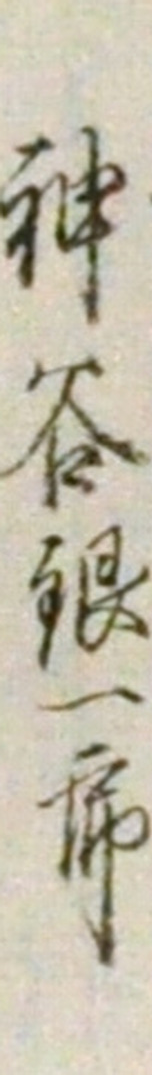神谷銀一郎
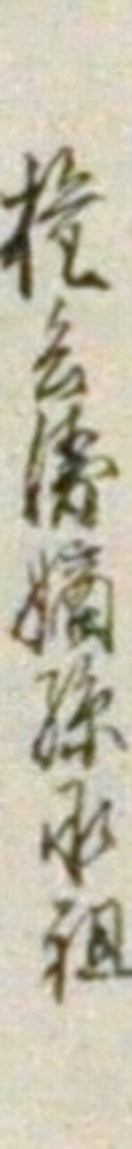権兵衛嫡孫承祖
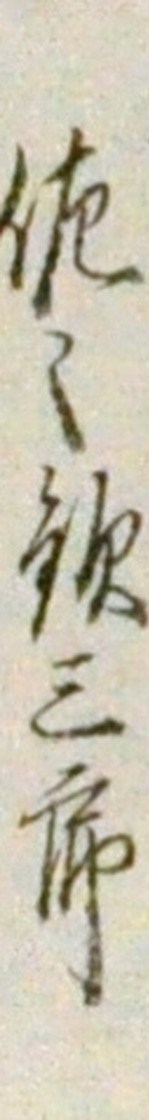佐々歓三郎
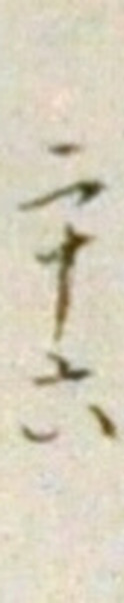二十六
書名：若年寄御役中之御書物〔一括〕
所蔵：伊那市立高遠町図書館・合同会社AMANE
